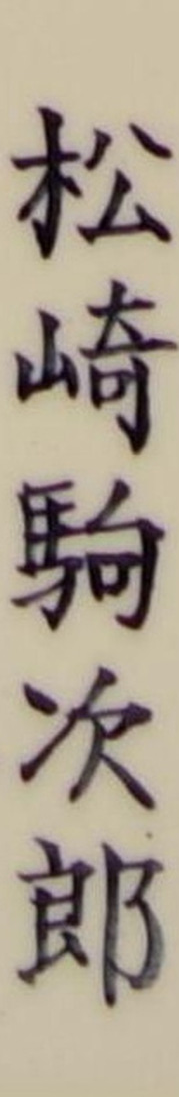松崎駒次郎
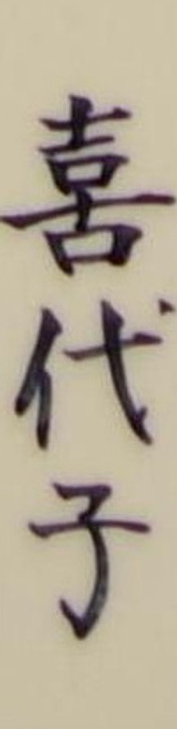喜代子
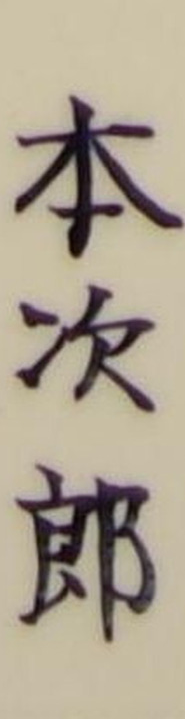本次郎
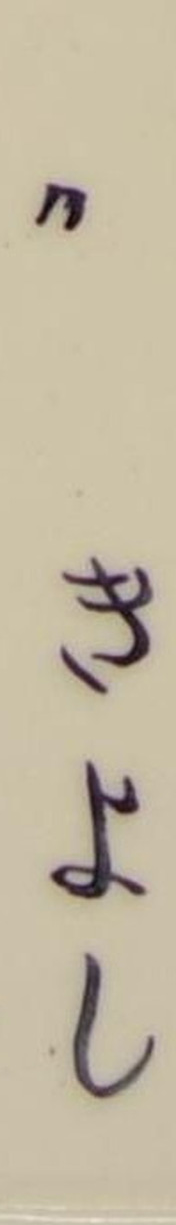きよし
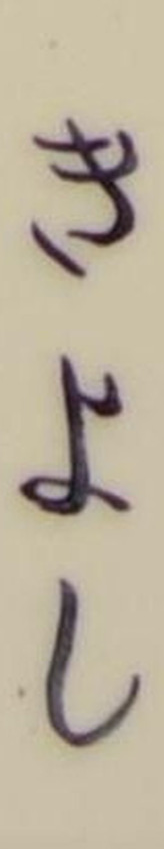きよし
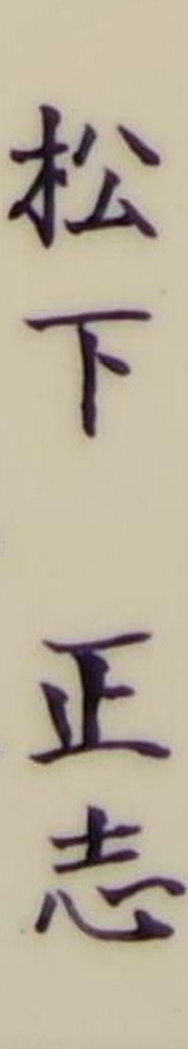松下正志
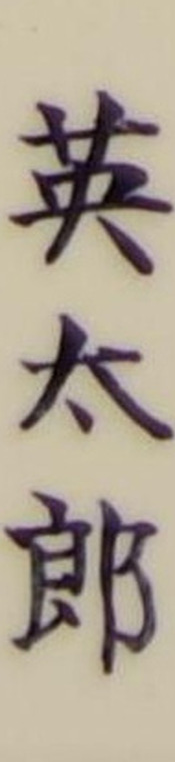英太郎
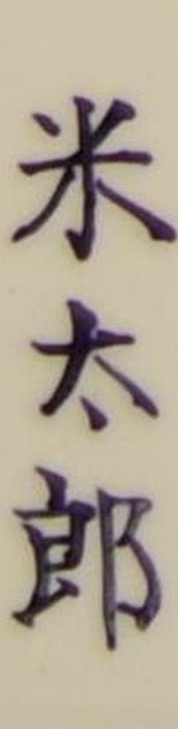米太郎
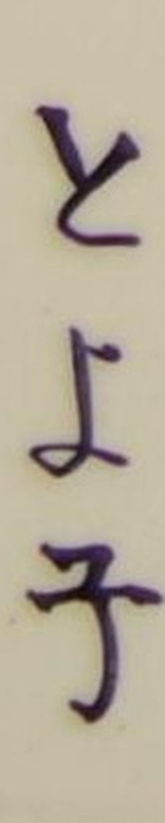とよ子

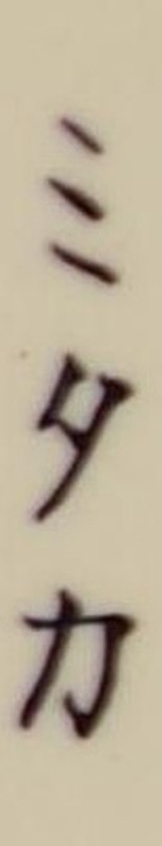ミタカ
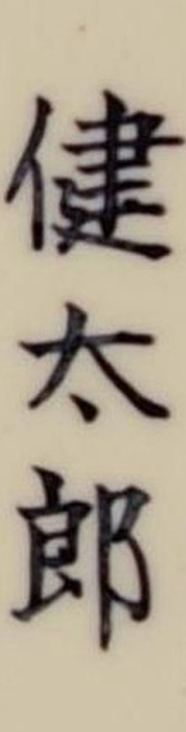健太郎
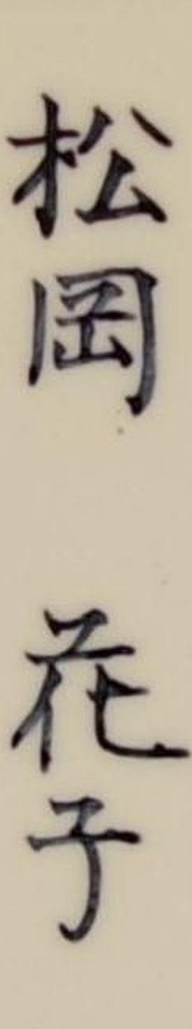松岡花子
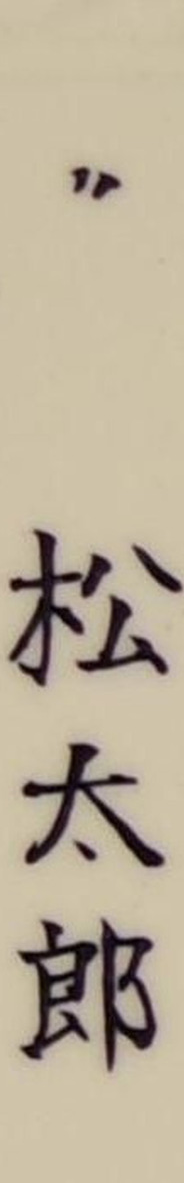松太郎
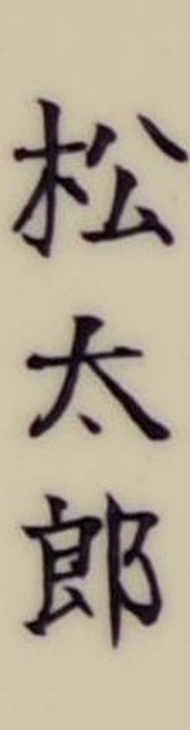松太郎
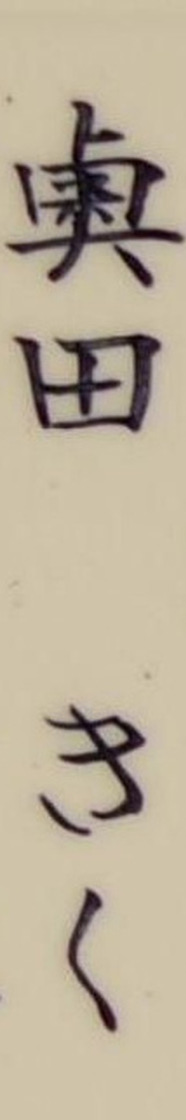奥田きく
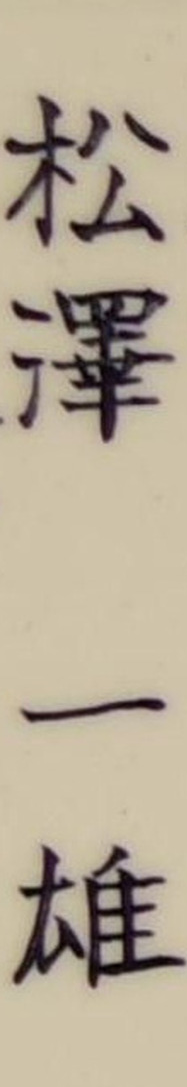松澤一雄
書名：A~D
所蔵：koyasan kongobuji
